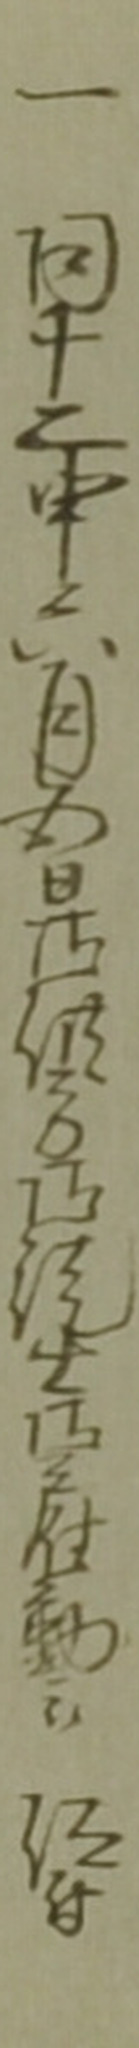一同十二申六月五日御供方御徒士御府勤被仰付
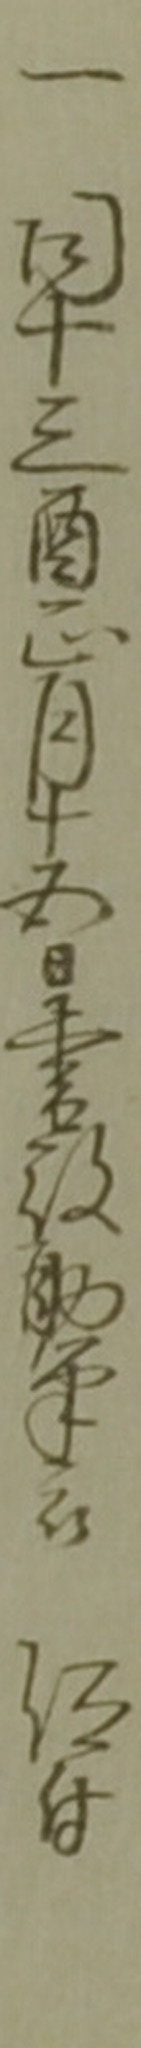一同十三酉正月十五日書役助筆被仰付
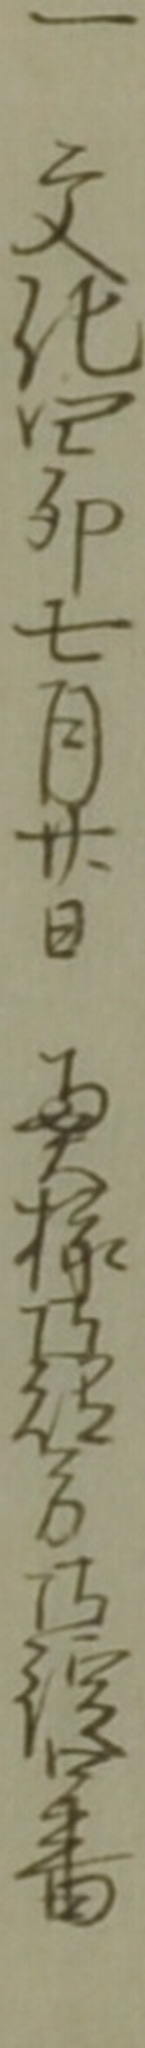一文化四卯七月廿日奥様御賄方御錠口番
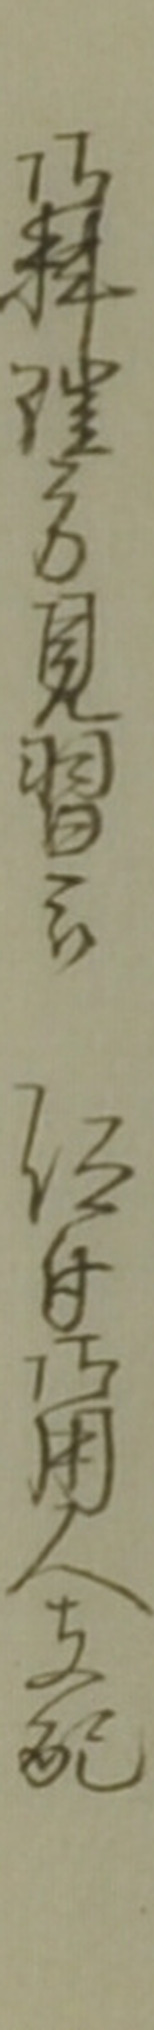御料理方見習被仰付御用人支配
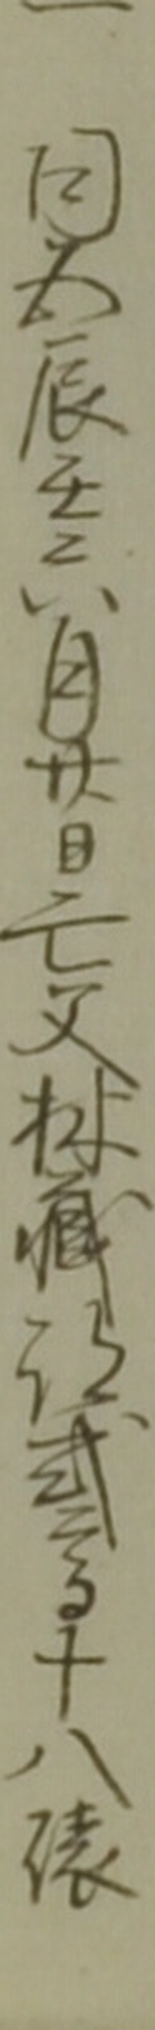一同五辰閏六月廿日亡父林蔵跡式高十八俵
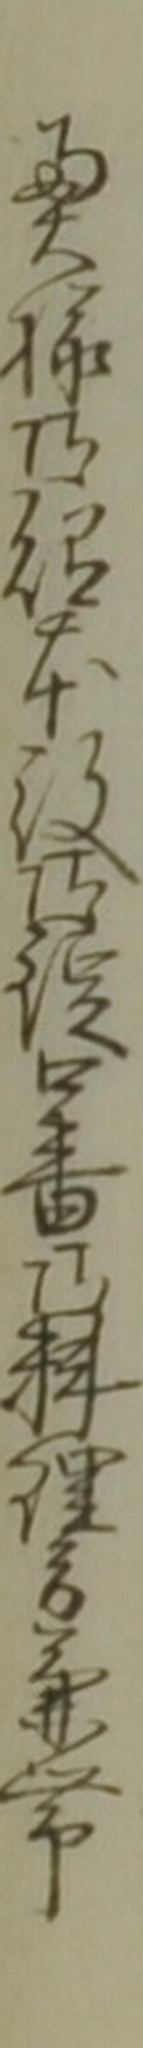奥様御賄本役御錠口番御料理方兼帯
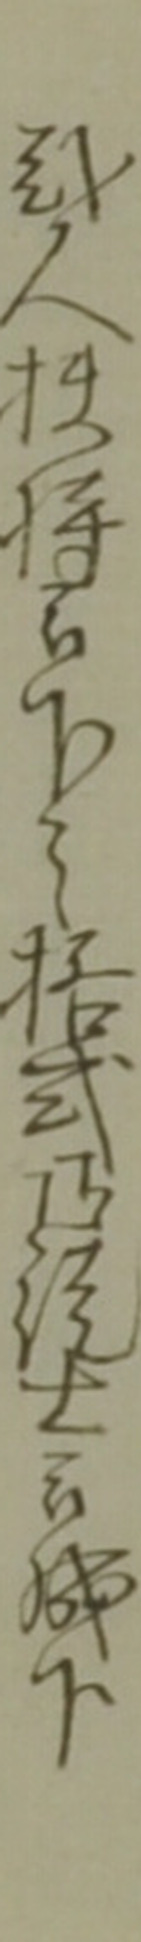弐人扶持被下之格式御徒士被成下
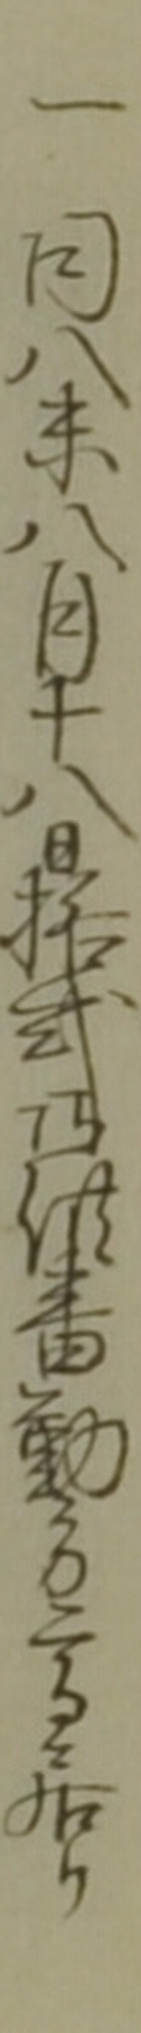一同八未八月十八日格式御供番勤方高居リ
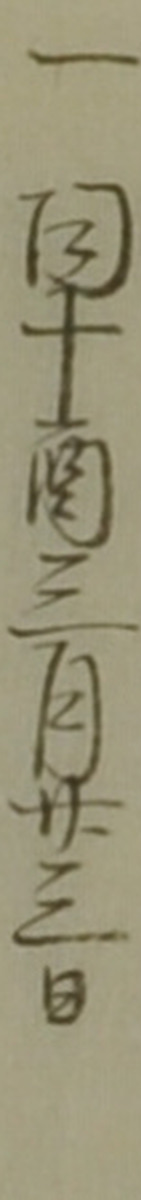一同十酉三月廿三日
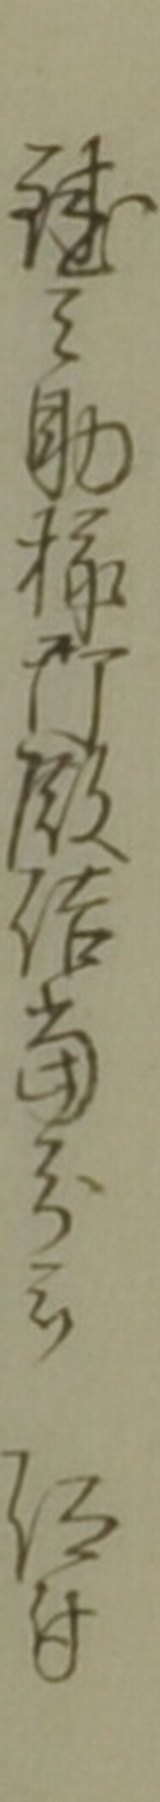銈之助様御殿詰当分被仰付
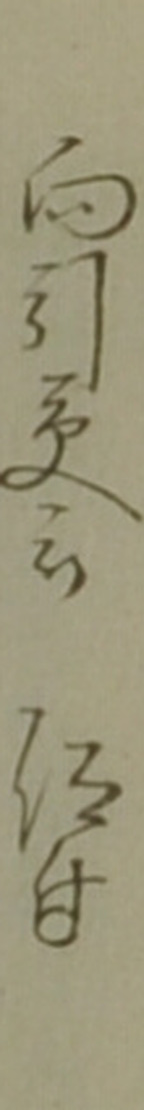向引受被仰付
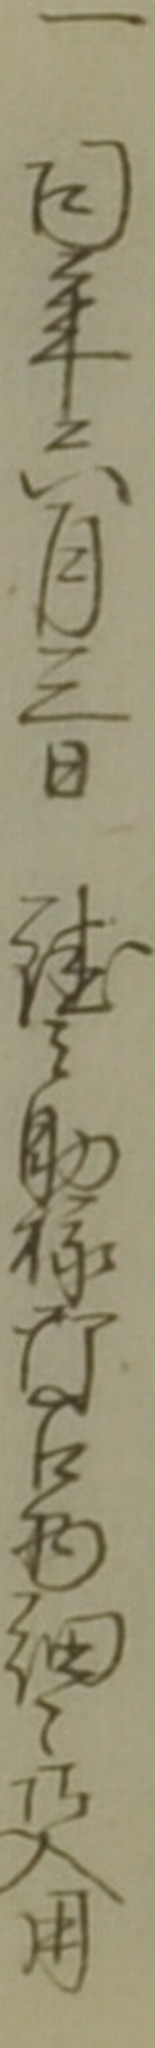一同年六月三日銈之助様御召物細々御入用
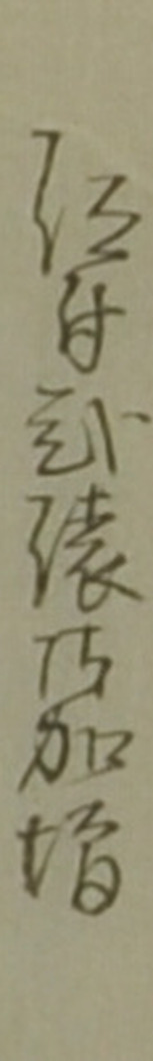仰付弐俵御加増
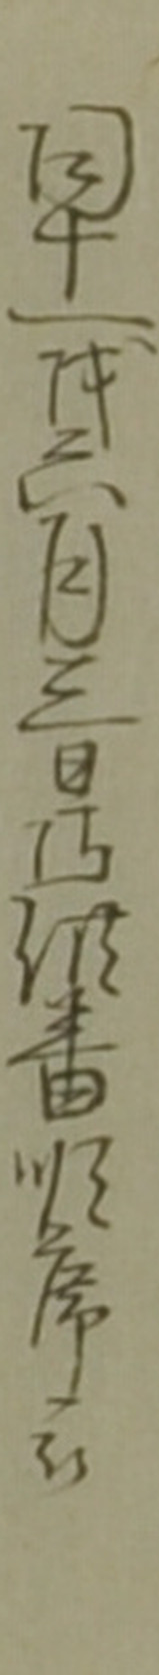一同十一戌六月三日御供番順席被
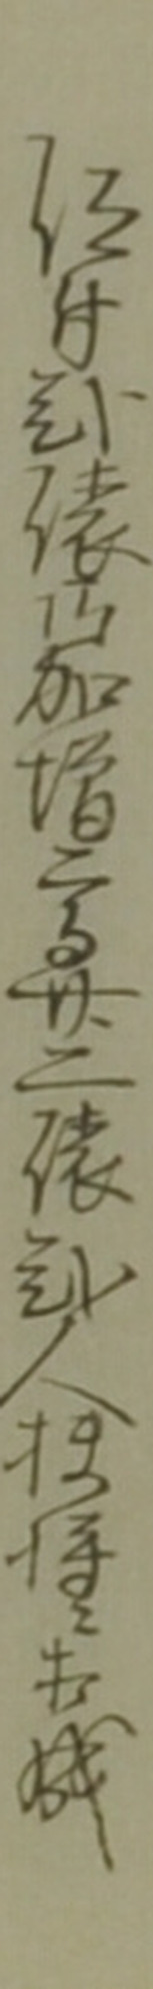仰付弐俵御加増高廿二俵弐人扶持ニ相成
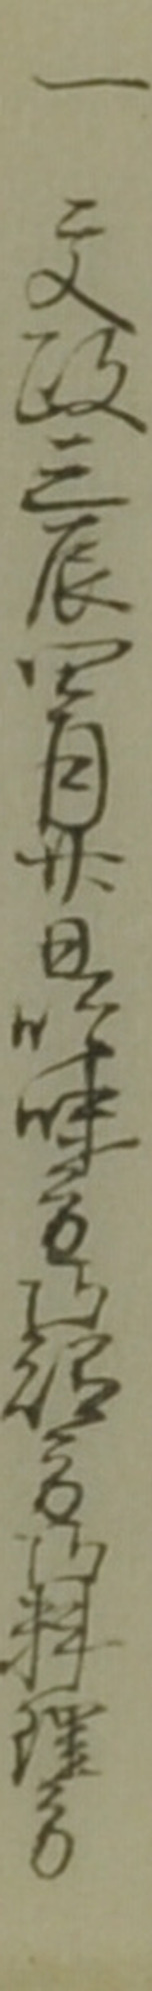一文政三辰四月廿日吟味方御賄方御料理方
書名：無足諸士勤仕録（一）
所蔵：伊那市立高遠町図書館・合同会社AMANE
